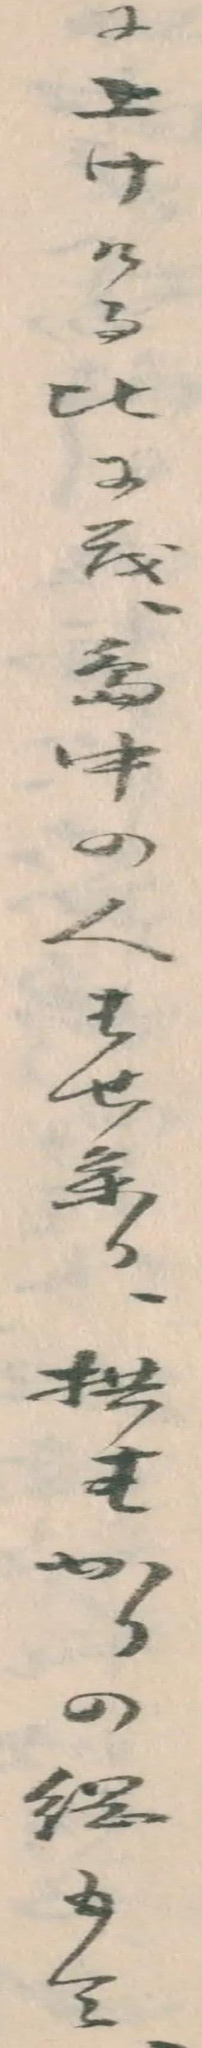に上けける頃にも、島中の人はせ参り、拱はかりの綱もて、
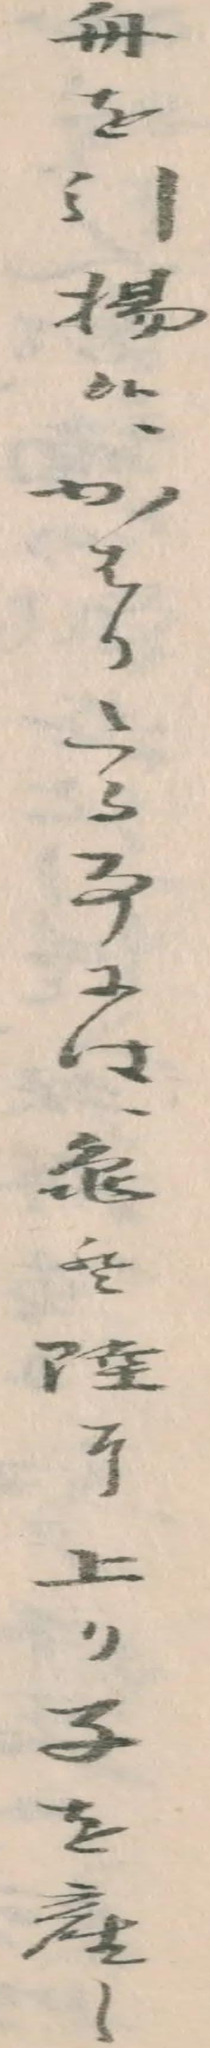舟を引揚候、かはりたる事には、亀と陸に上り子を産し
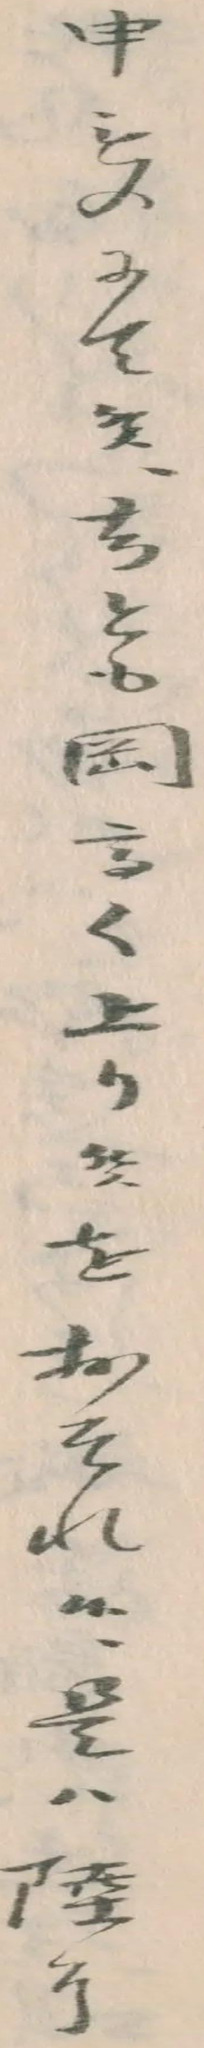申ものにて候、ちとも岡高く上り候をおそれ候、是は陸に
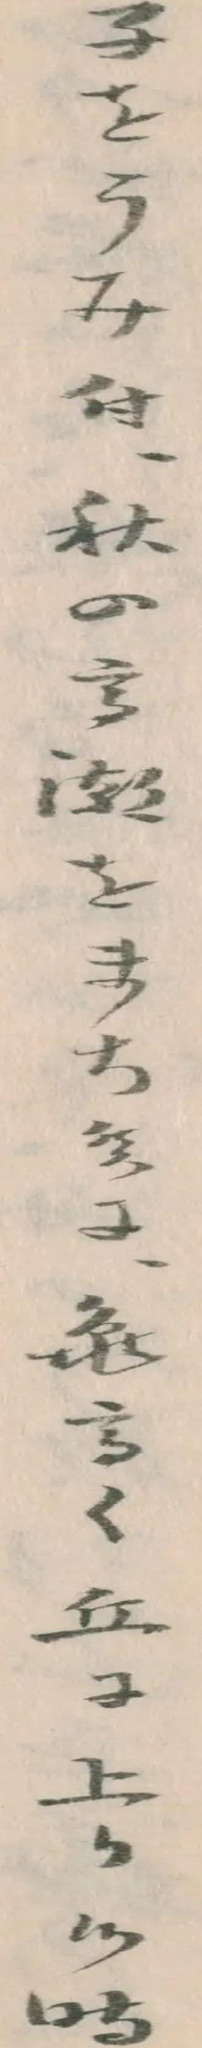子をうみ付、秋の高潮をまち候に、亀高く丘に上り候時
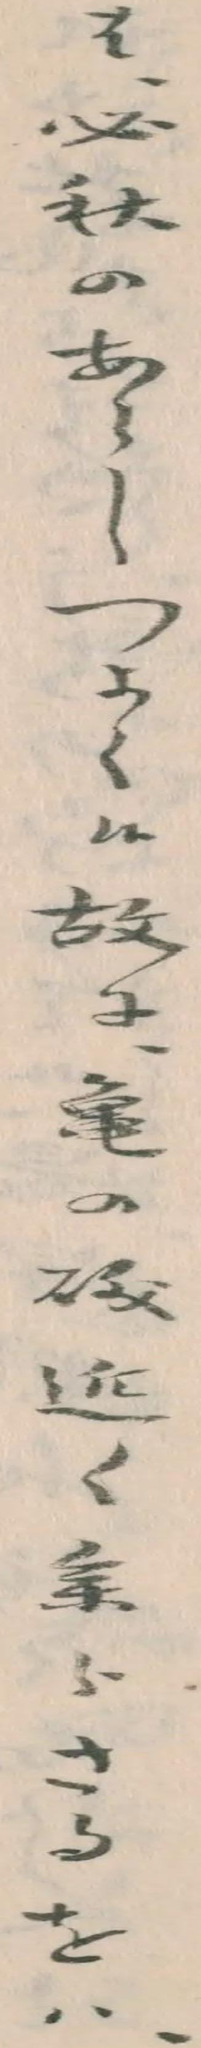は、必秋のあらしつよく候故に、亀の磯近く参らさるをは、
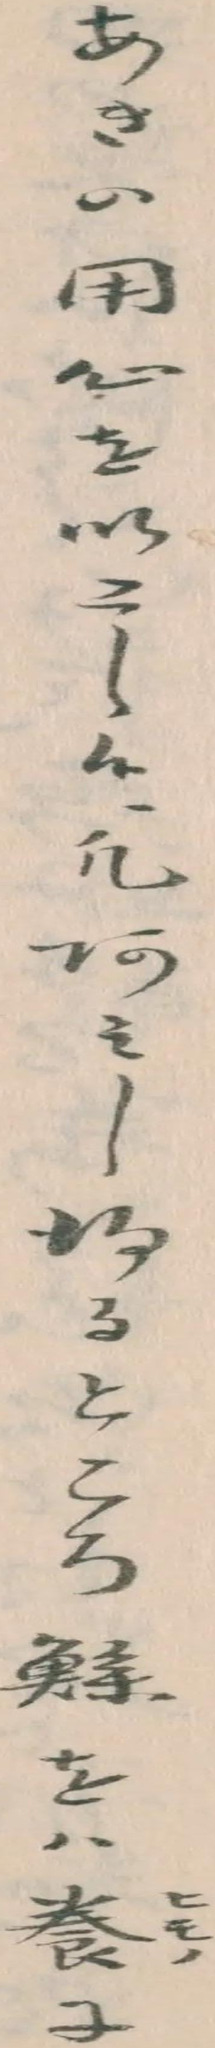あきの用心をいたし候、凡何そし得るところ鯵をは養に
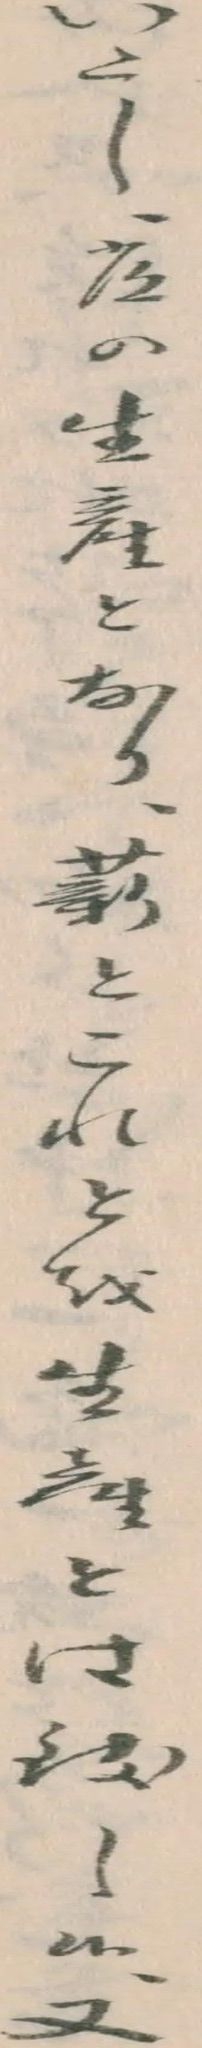いたし、常の生産となり、薪とこれとを生産とは致し候、又
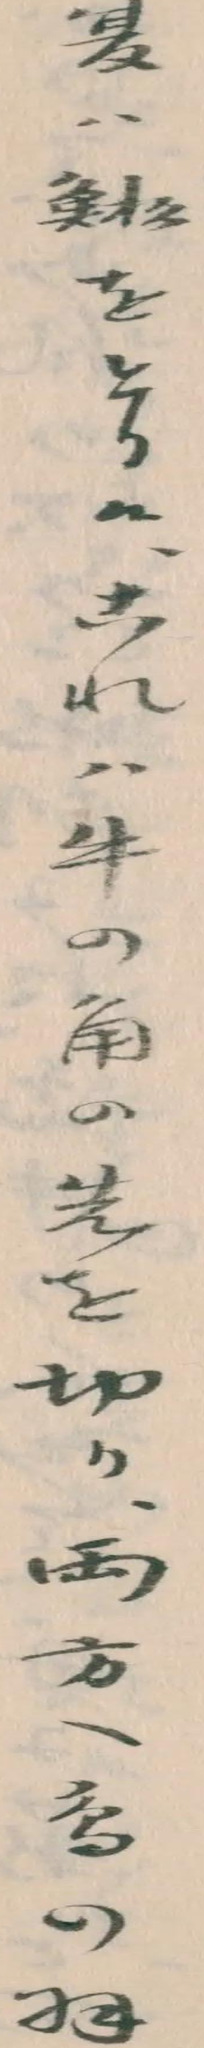夏はをとり候、これは牛の角の先を切り、両方へ鳥の羽
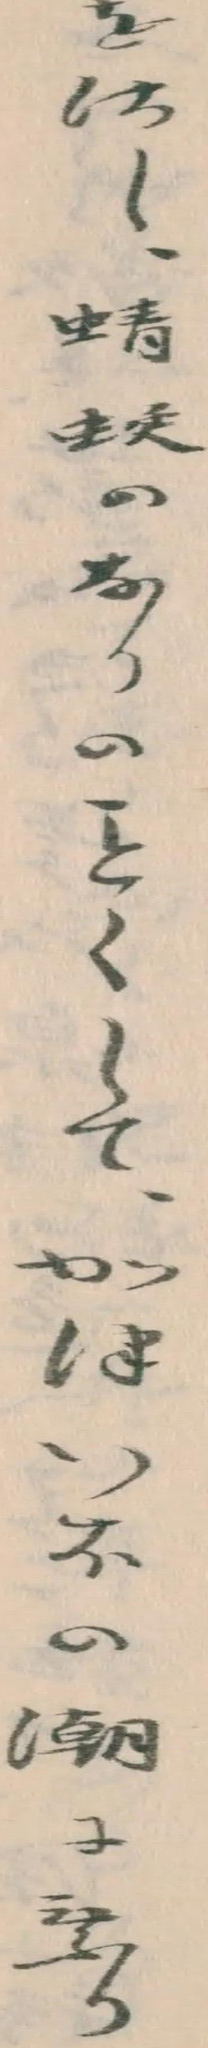をさし、蜻蜓のなりのことくして、かついほの潮に乗り
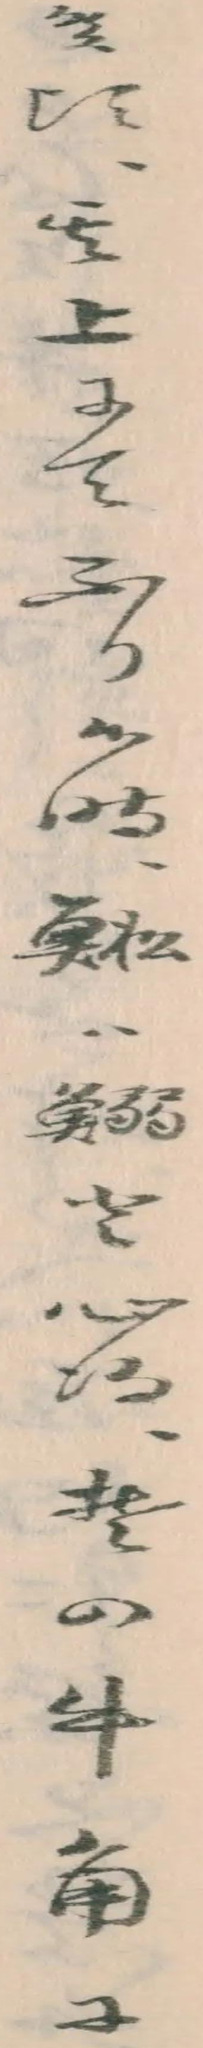候頃、其上にてふり候時、は鰯と心得、その牛角に
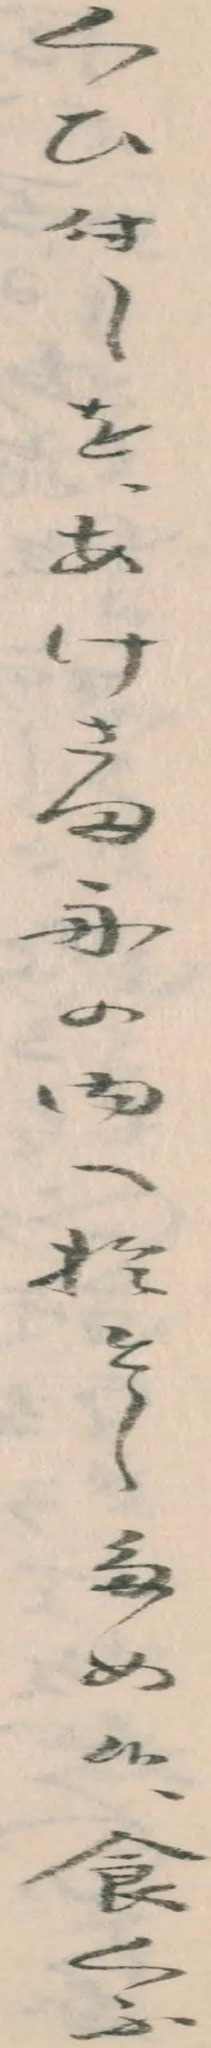くひ付しを、あけさま舟の内へおとしため候、食くふ
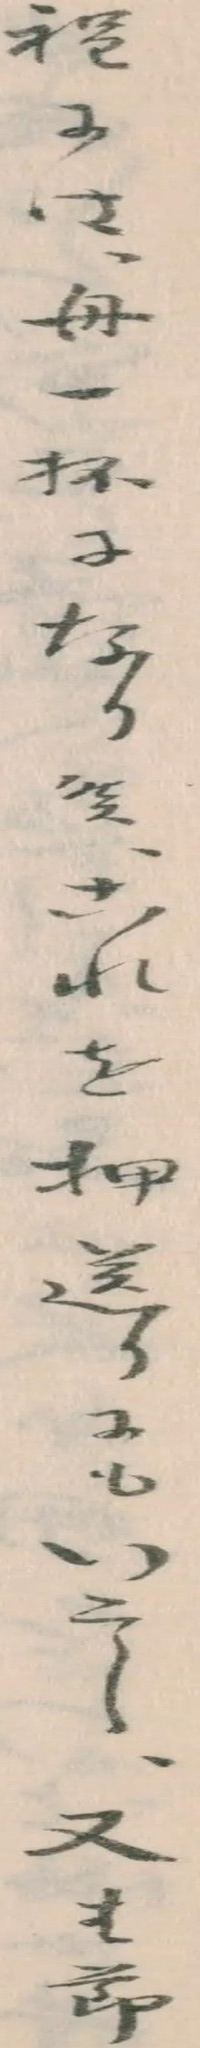程には、舟一杯になり候、これを押送りにもいたし、又は節
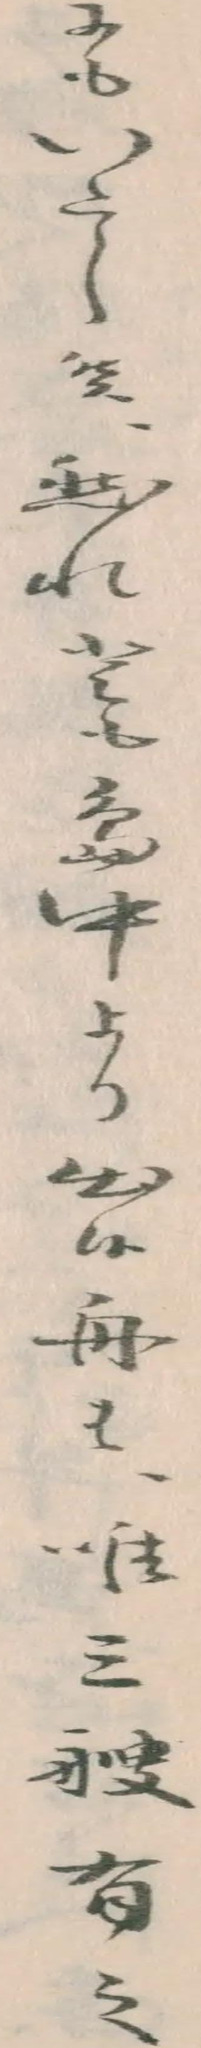にもいたし候、然れとも島中より出候舟は、唯三艘有之
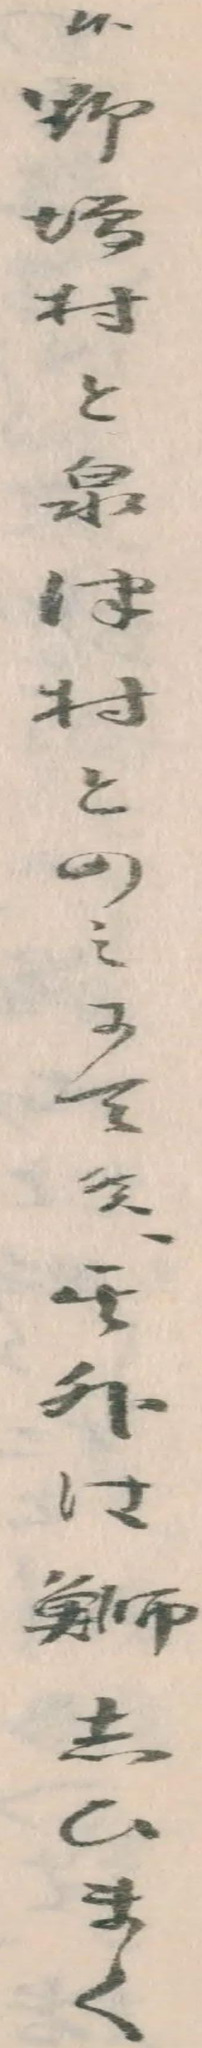候野増村と泉津村とのみにて候、其外は鰤しひまく
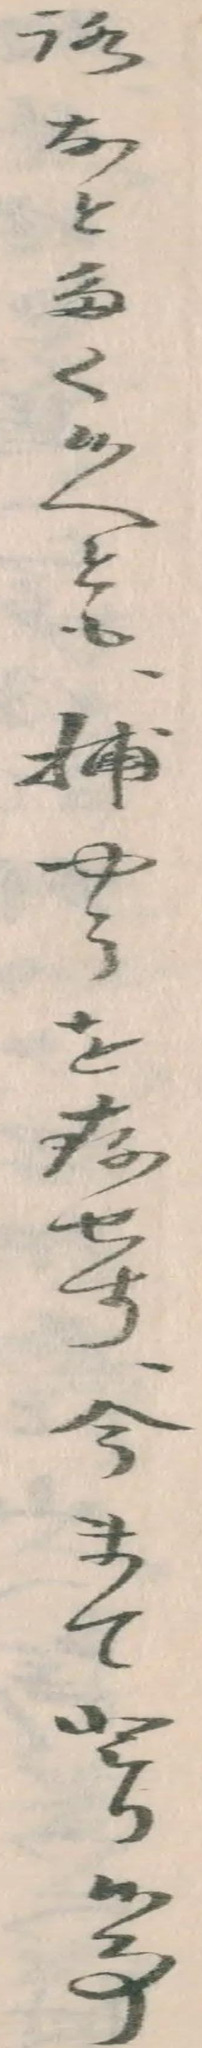ろなと多く候へとも、捕やうを存せす、今まてとり候事
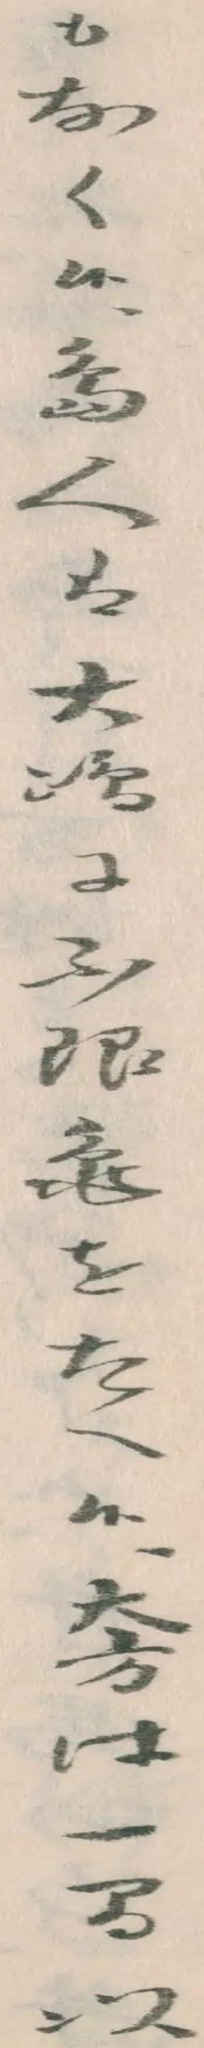もなく候、島人は大嶋に不限亀をたへ候、大方は一間以
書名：地災撮要. 巻11-12(地震之部)
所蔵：国立国会図書館 National Diet Library, JAPAN
